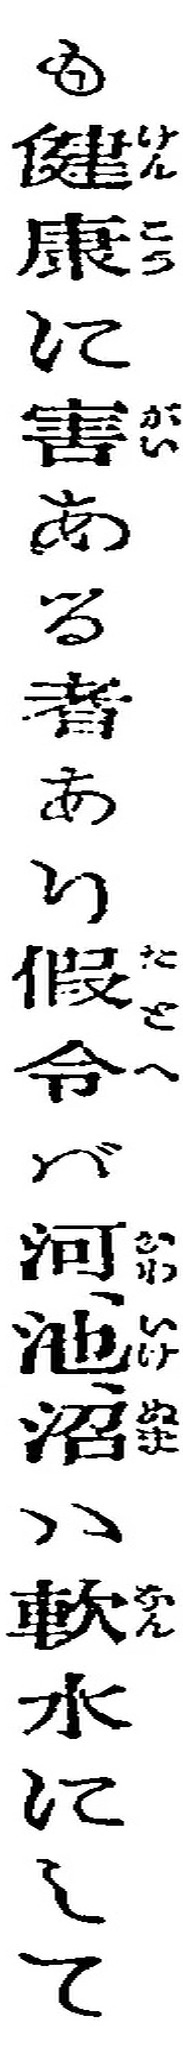も健康に害ある者あり假令は河、池、沼は軟水にして
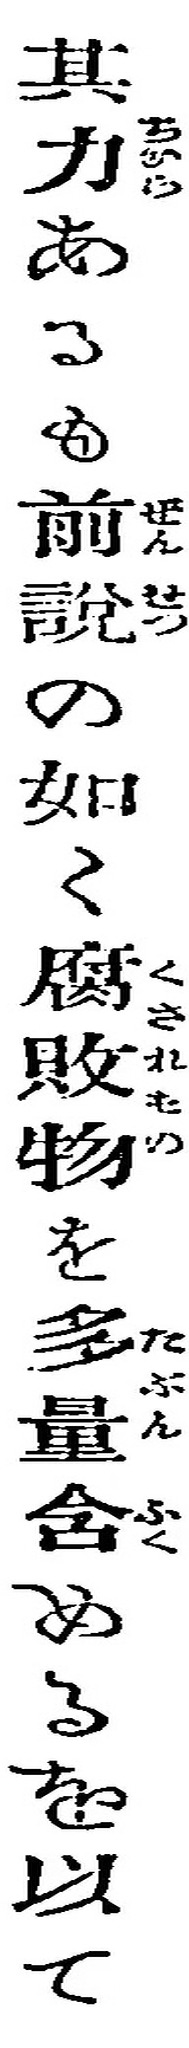其力あるも前説の如く腐敗物を多量含めるを以て
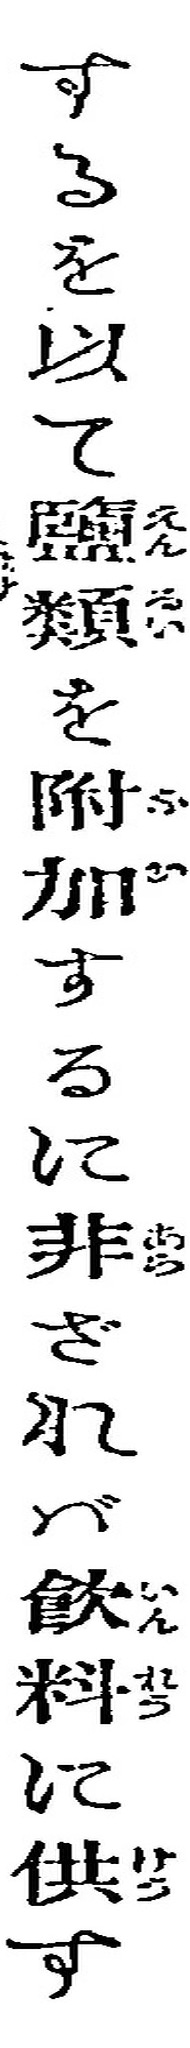するを以て鹽類を附加するに非ざれば飲料に供す
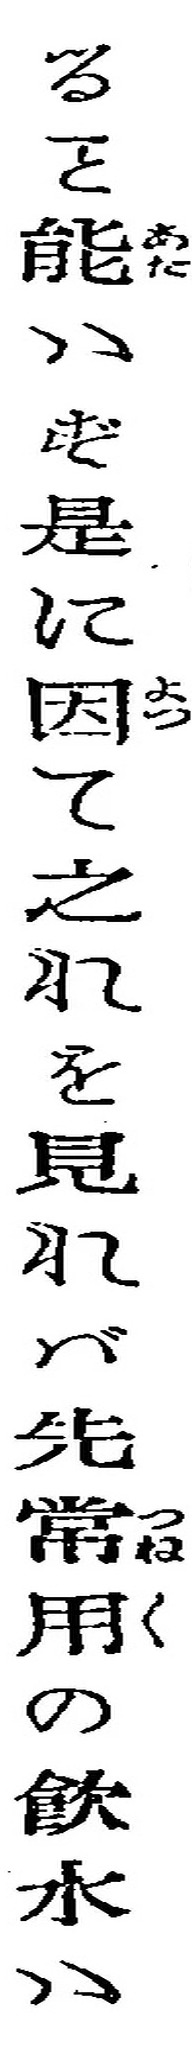ること能はず是に因て之れを見れば先常用の飲水は
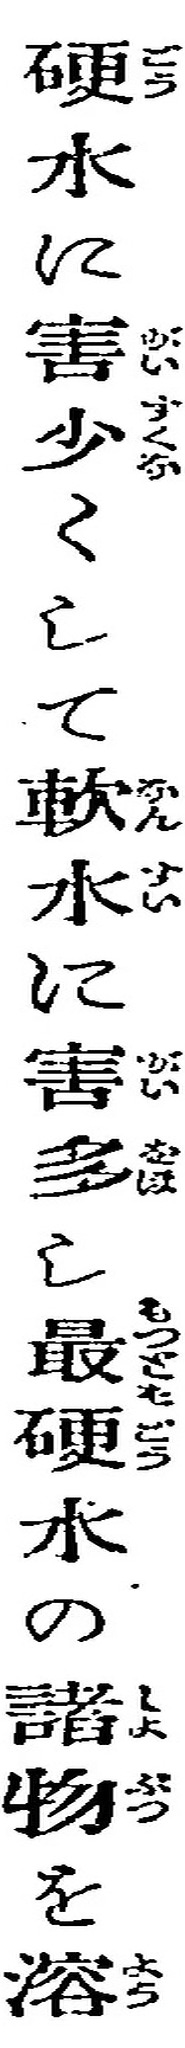硬水に害少くして軟水に害多し最硬水の書物を溶
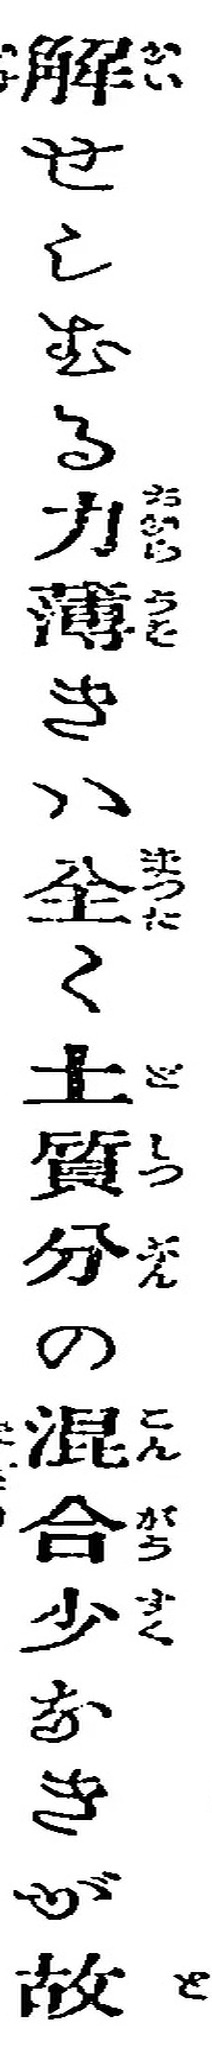解せしむる力薄きは全く土質分の混合少なきが故
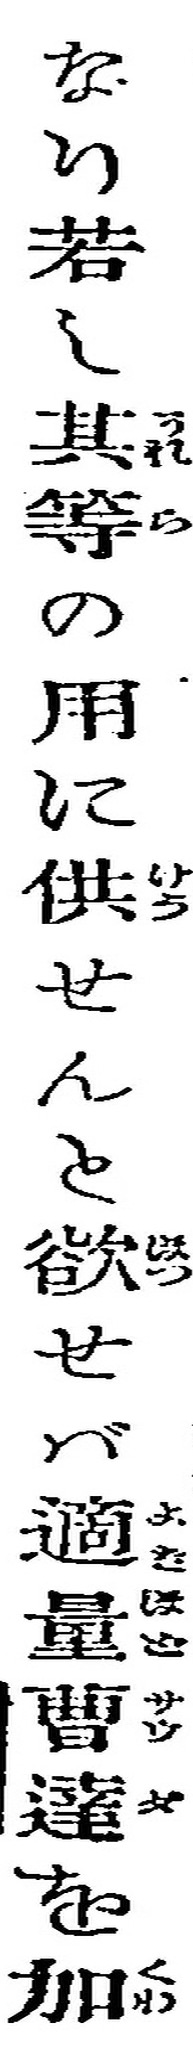なり若し其等の用に供せんと欲せば適量曹達を加
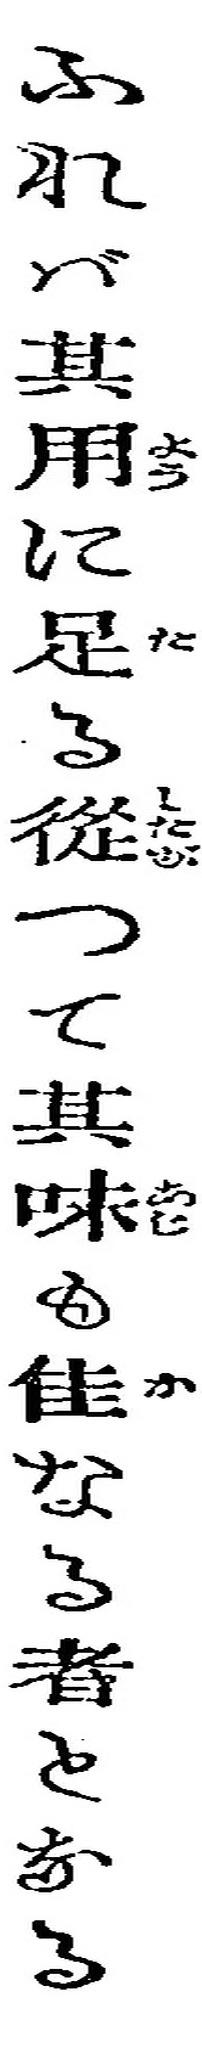ふれば其用に足る従つて其味も佳なる者となる
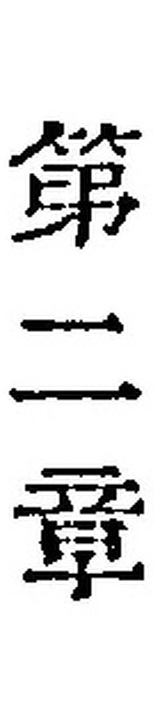第二章
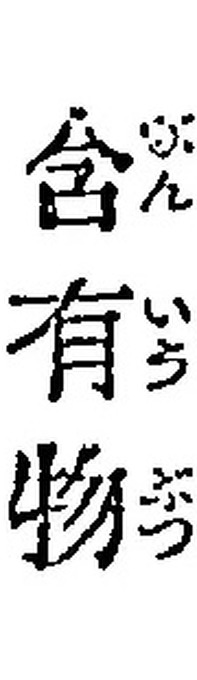含有物
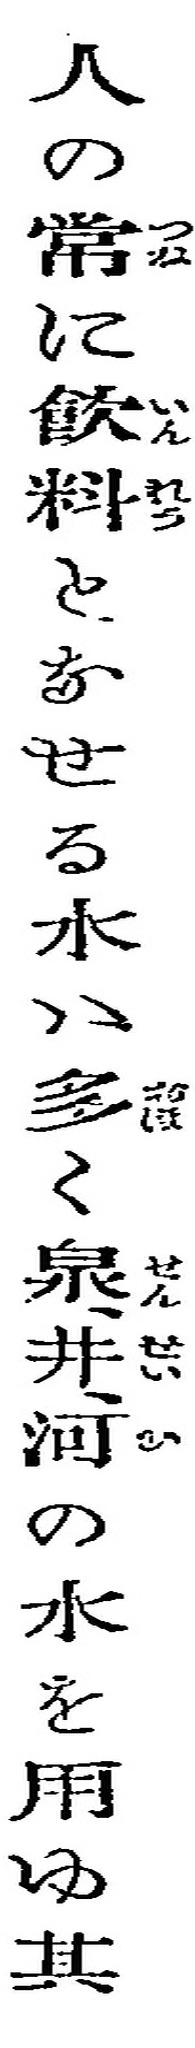人の常に飲料となせる水は多く泉、井、河の水を用ゆ其
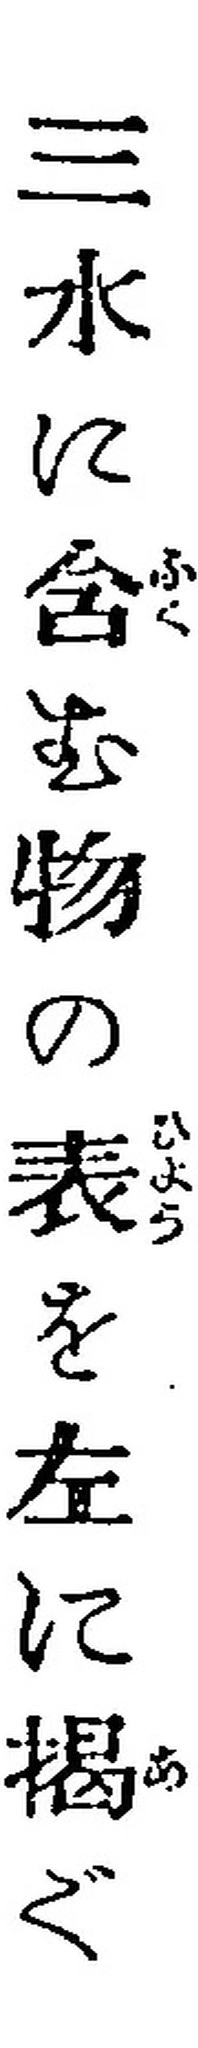三水に含む物の表を左に掲ぐ
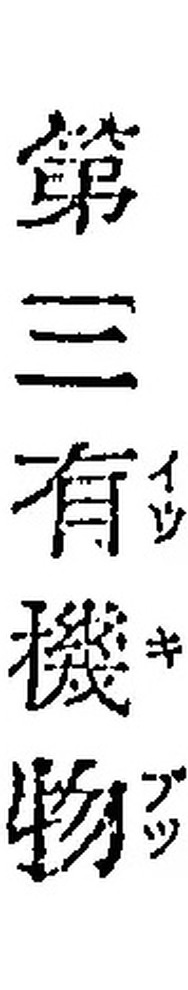第三有機物
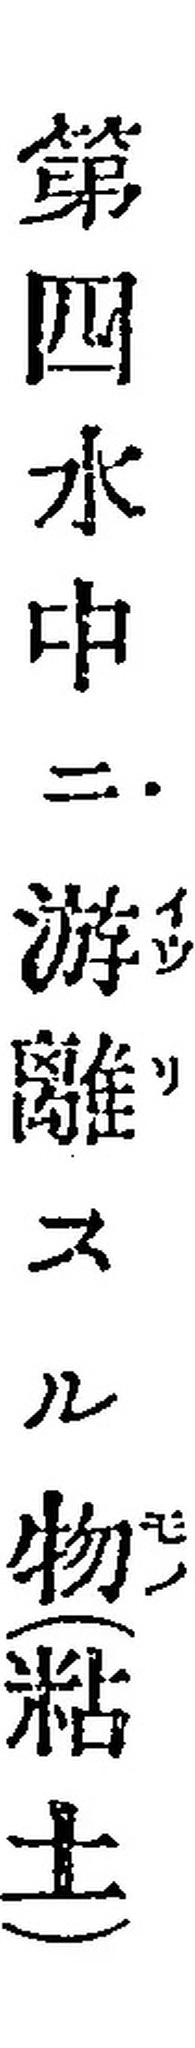第四水中に游離する物[粘土]

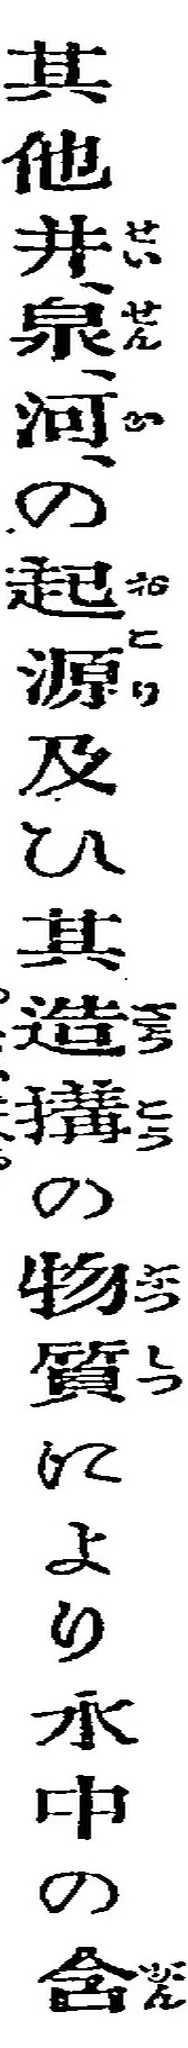其他井、泉、河、の起源及ひ其造搆の物質により水中の含
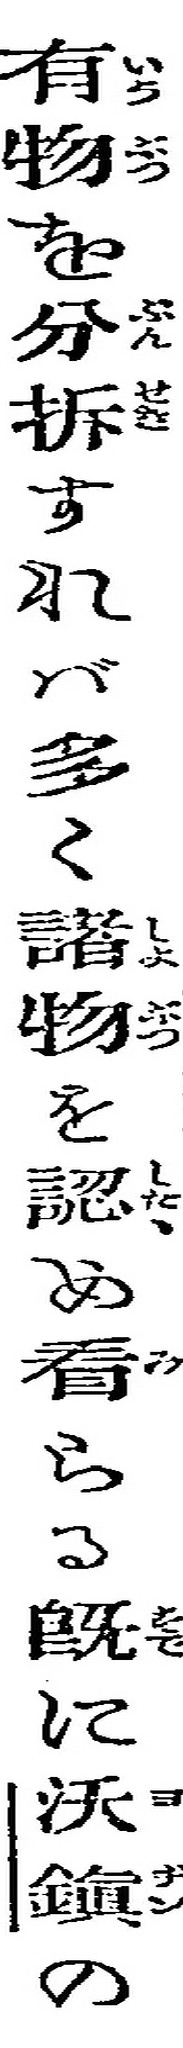有物を分析すれば多く諸物を認め看らる既に沃鎭の
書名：飲水の心得 : 伝染病の予防
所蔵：国立国会図書館 National Diet Library, JAPAN
